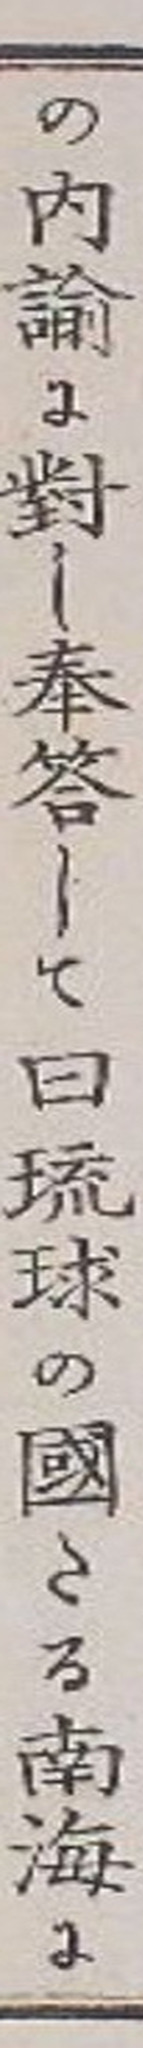の内諭に対し奉答して曰琉球の国たる南海に
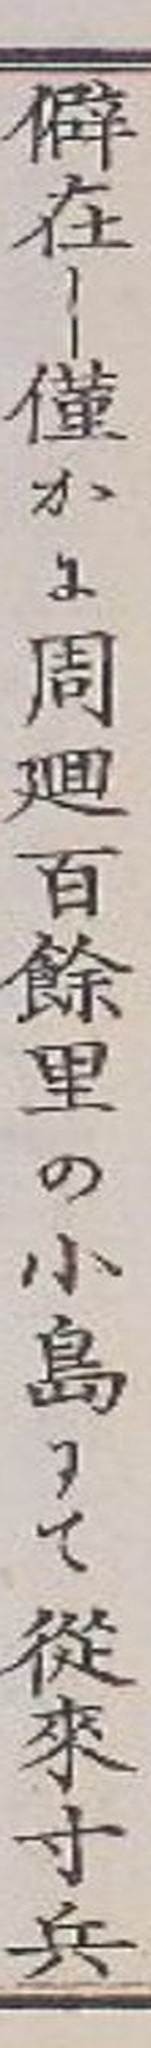僻在し僅かに周廻百余里の小島にて従来寸兵
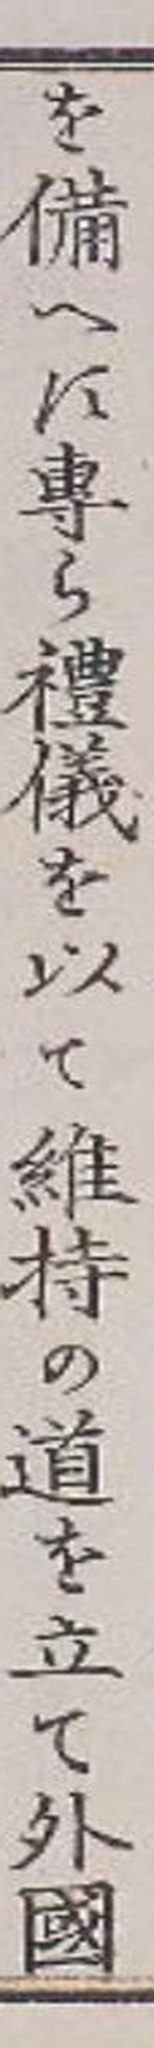を備へす専ら礼儀を以て維持の道を立て外国
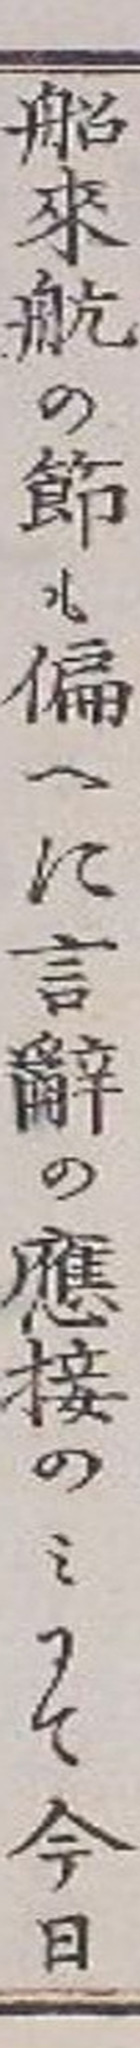船来航の節も偏へに言辞の応接のみにて今日
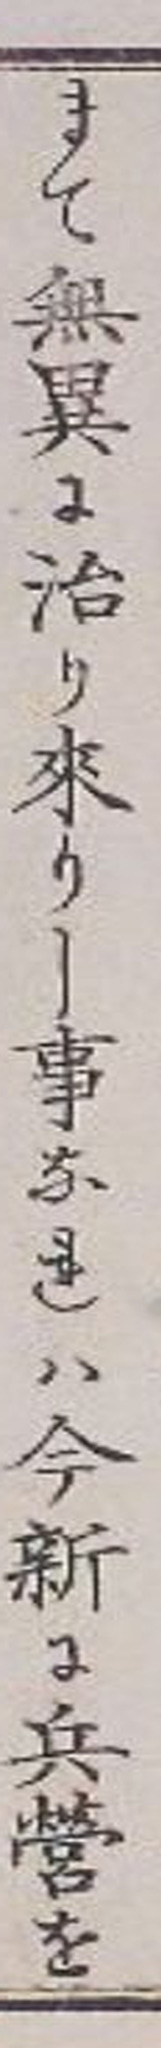まて無異に治り来りし事なれは今新に兵営を
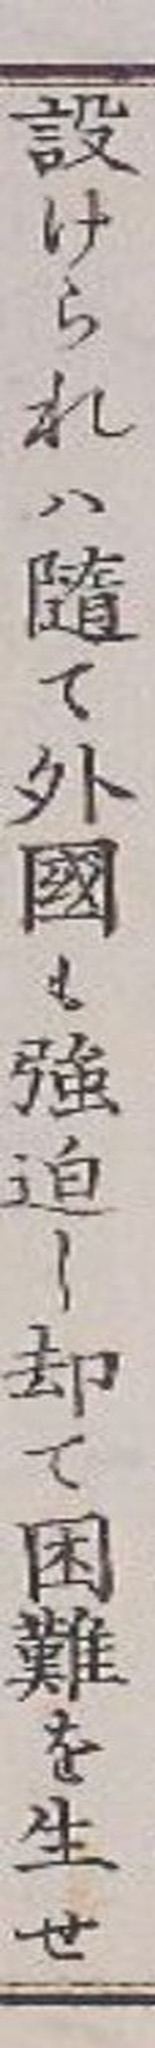設けられは随て外国も強迫し却て困難を生せ
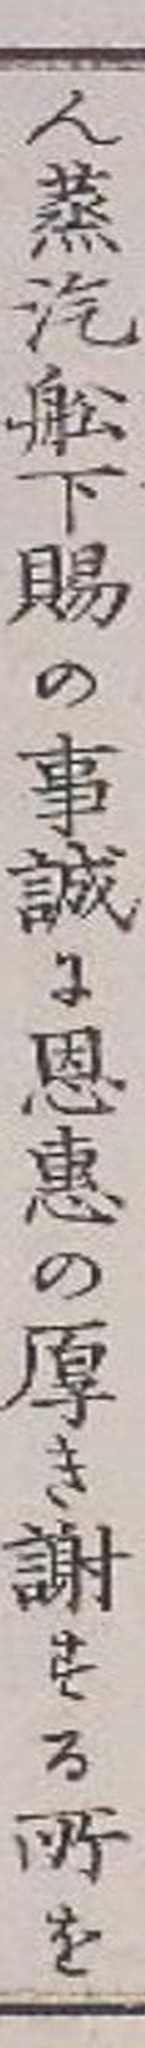ん蒸気船下賜の事誠に恩恵の厚き謝する所を
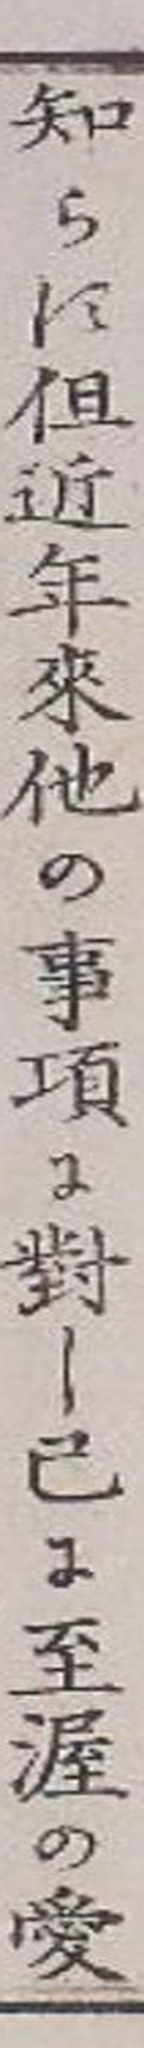知らす但近年来他の事項に対し已に至渥の愛
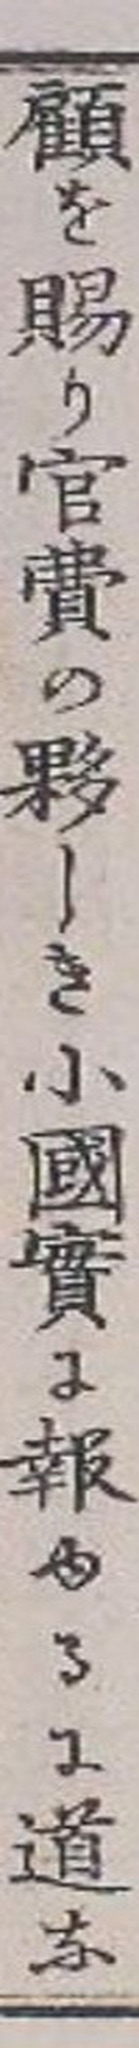顧を賜り官費の夥しき小国実に報ゆるに道な

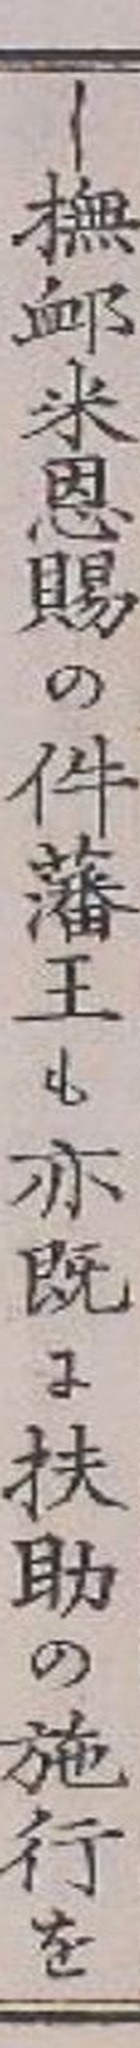し撫卹米恩賜の件藩王も亦既に扶助の施行を
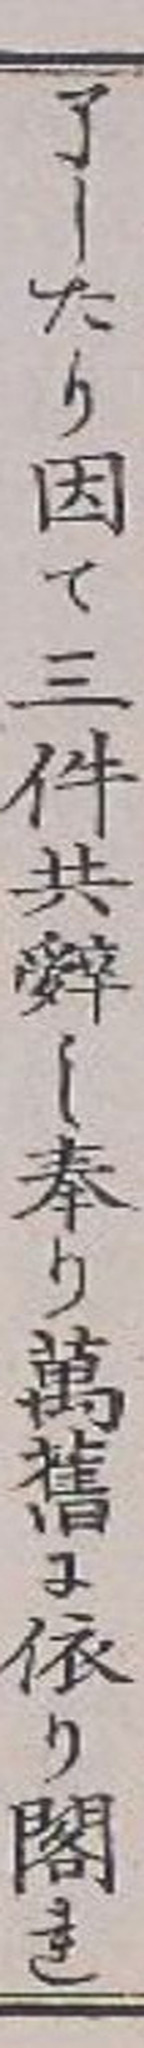了したり因て三件共辞し奉り万旧に依り閣れ
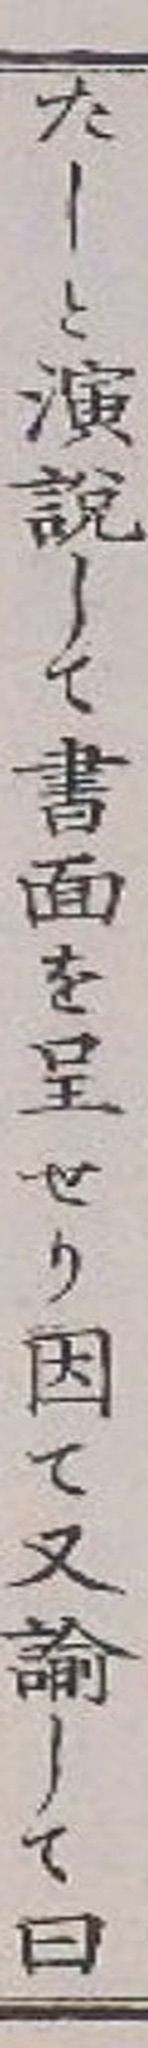たしと演説して書面を呈せり因て又諭して曰
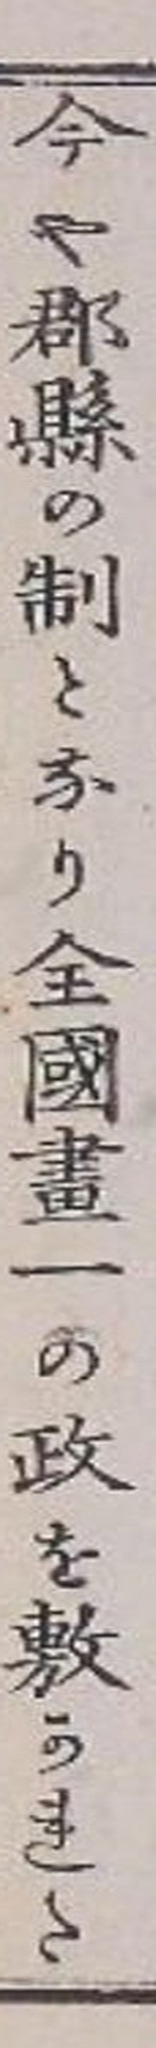今や郡県の制となり全国画一の政を敷かれた
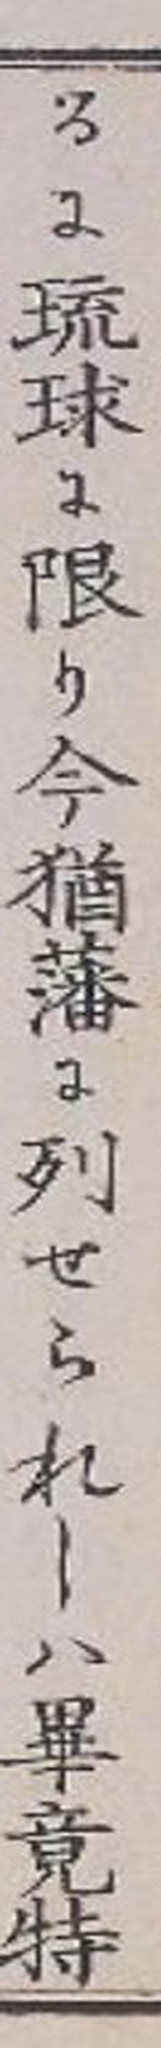るに琉球に限り今猶藩に列せられしは畢竟特
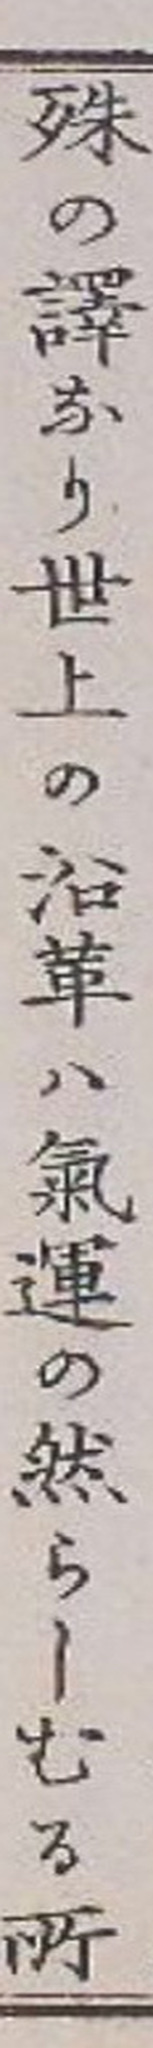殊の訳なり世上の沿革は機運の然らしむる所
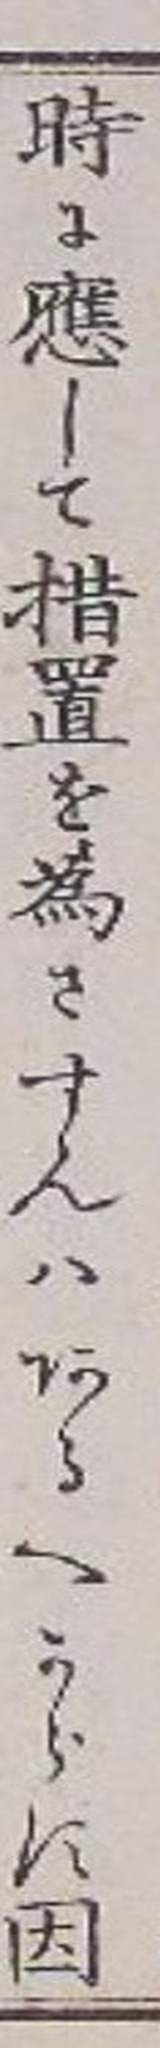時に応して措置を為さすんはあるへからす因
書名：南島紀事 下
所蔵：University of the Ryukyus Library
